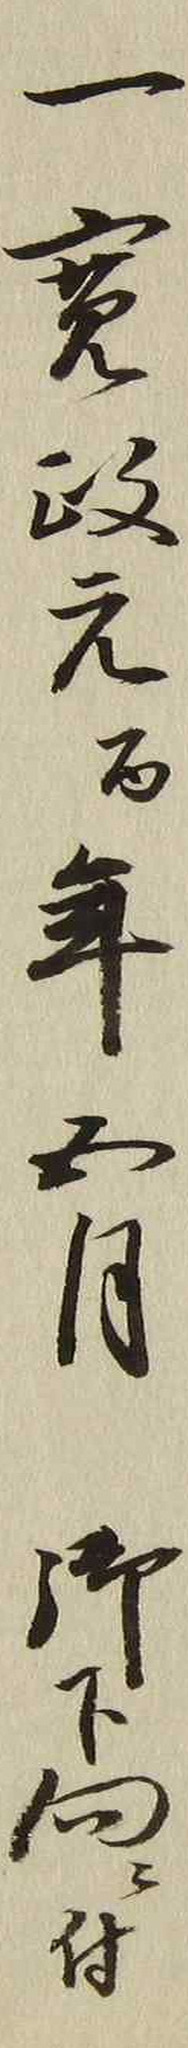一寛政元酉年五月御下向ニ付
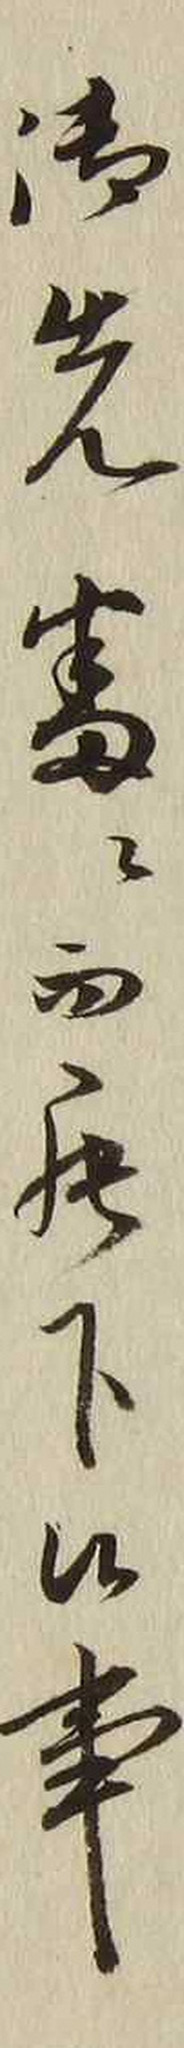御先番ニ而罷下候事
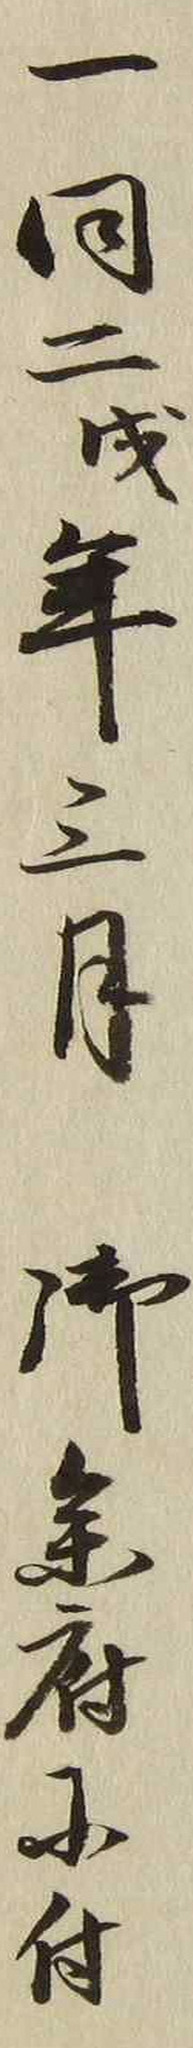一同二戌年三月御参府に付
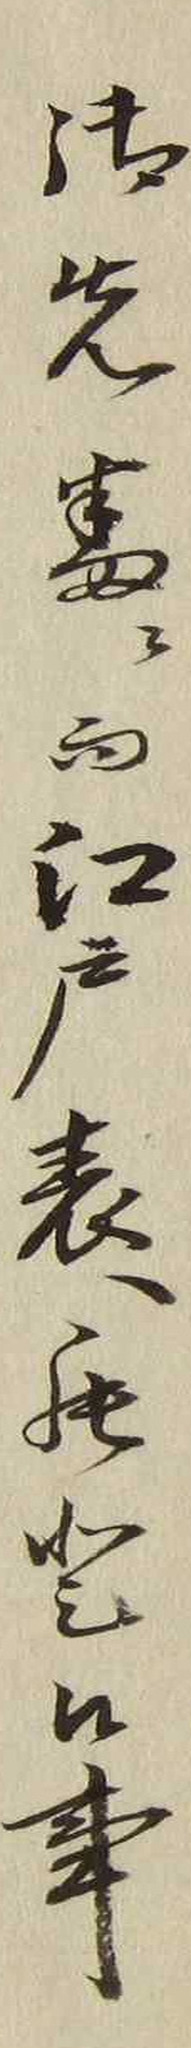御先番ニ而江戸表へ罷登候事
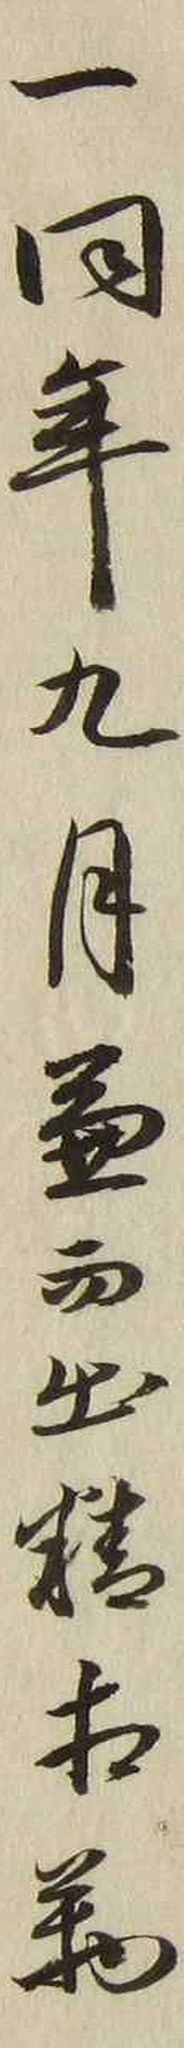一同年九月兼而出精相勤

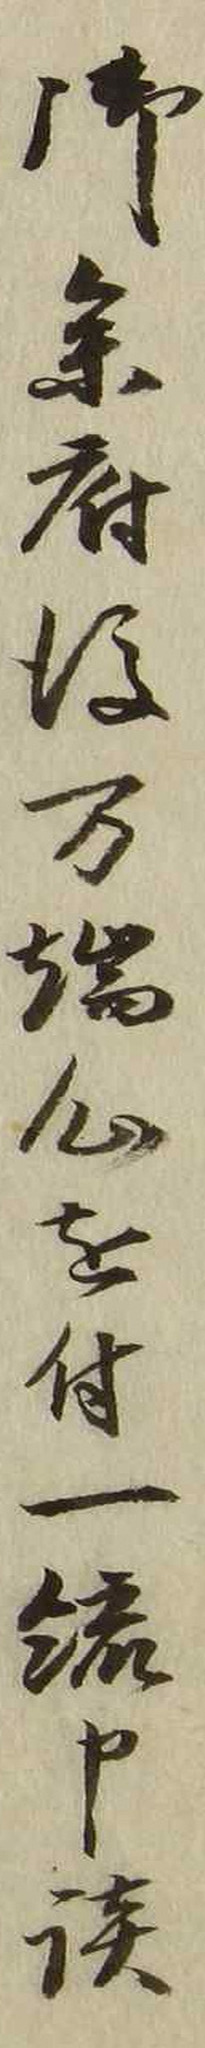御参府後万端心を付一統申談
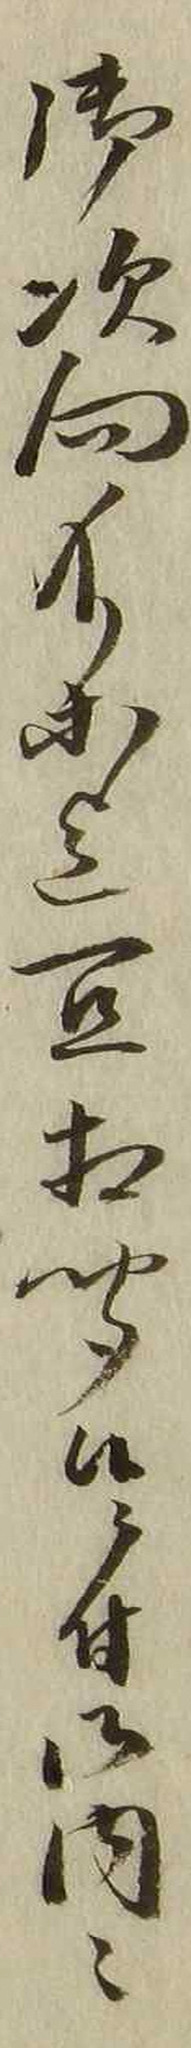御次向〆り等迄宜相聞候ニ付御内々
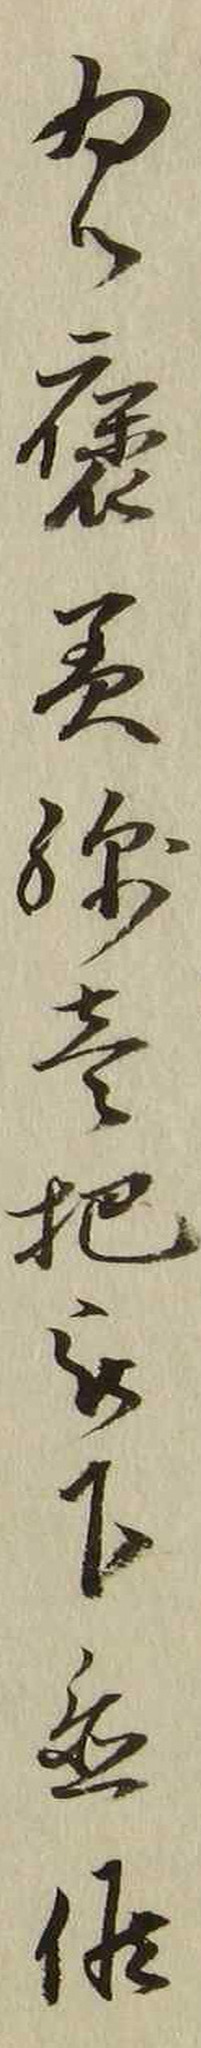為御褒美綿壱把被下置候
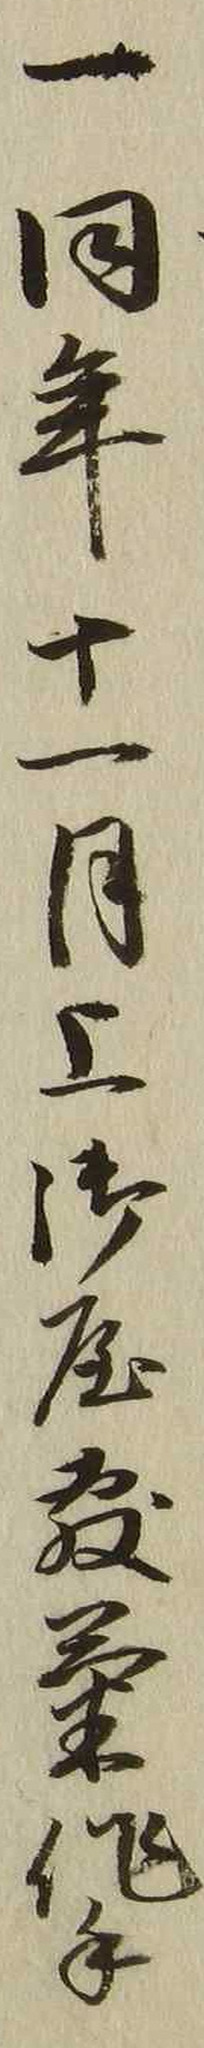一同年十一月上御屋敷菊作手
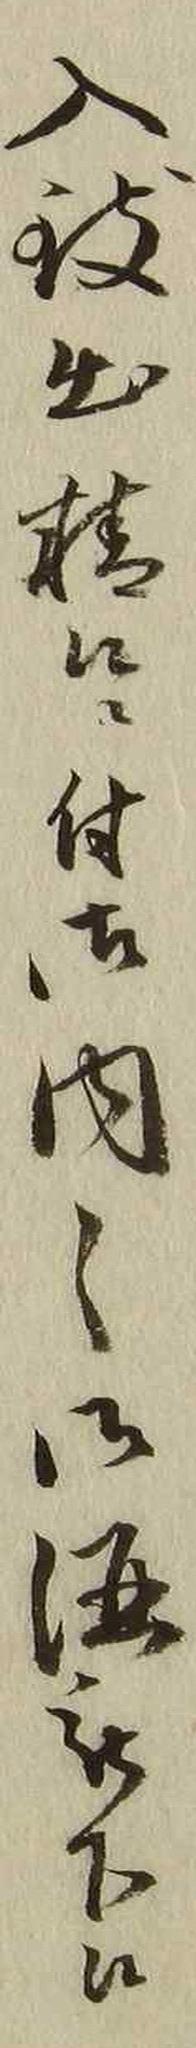入致出精候ニ付御内々御酒被下候
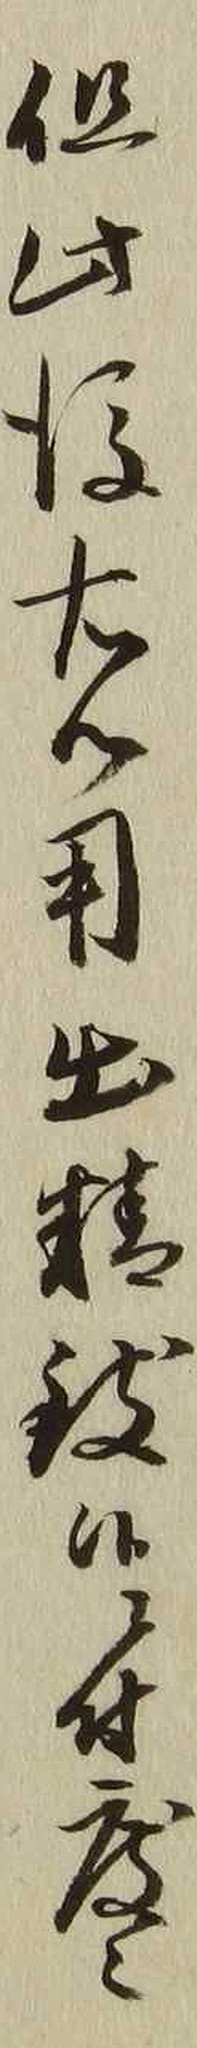但此後右候用出精致候ニ付度々
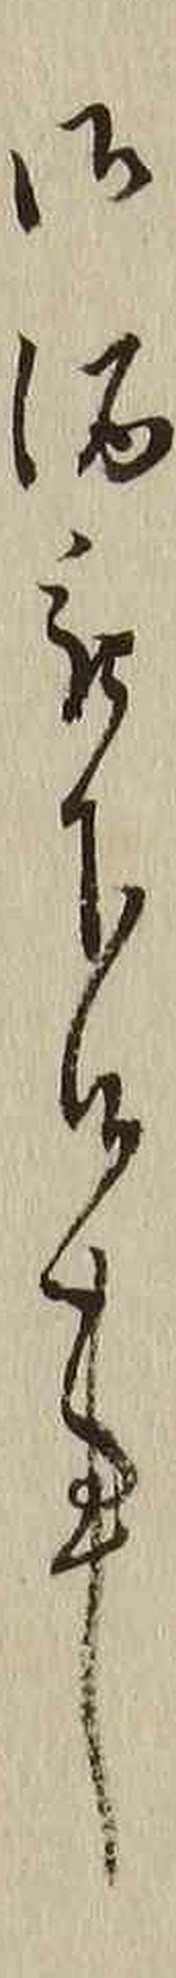御酒被下候事
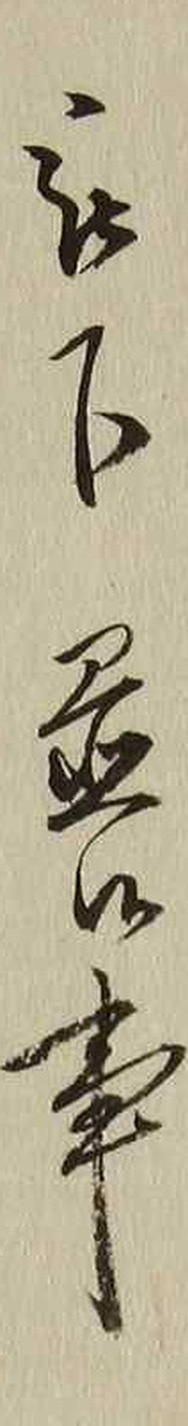被下置候事
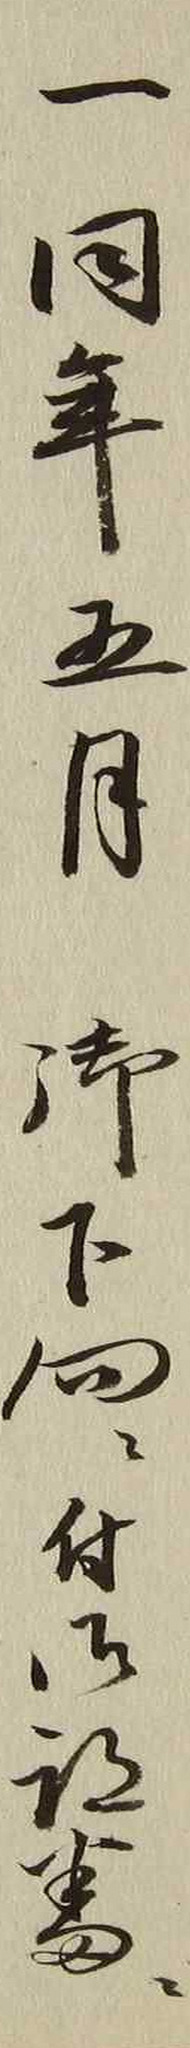一同年五月御下向ニ付御跡番ニ
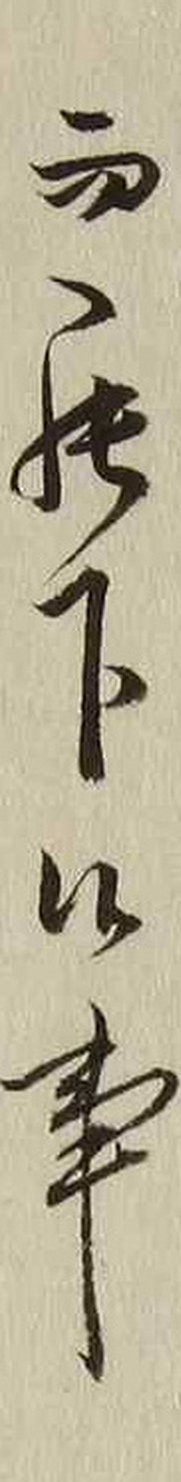而罷下候事
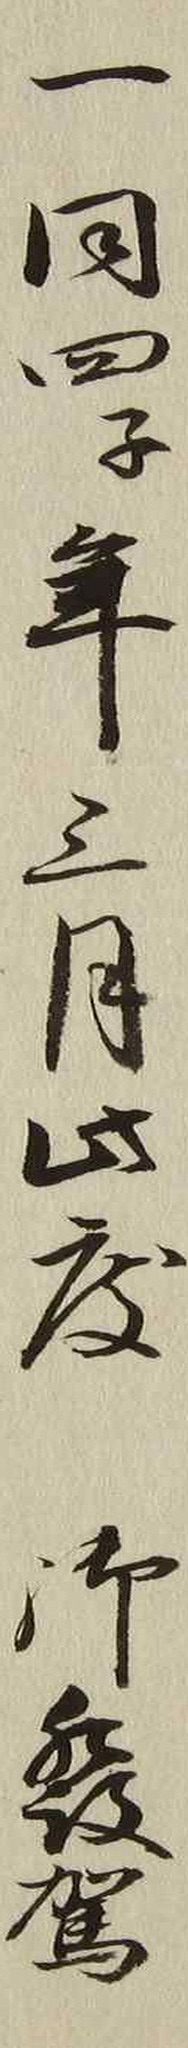一同四子年三月此度御発駕
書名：諸士系譜　巻之61　と之部4
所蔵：会津若松市立会津図書館
